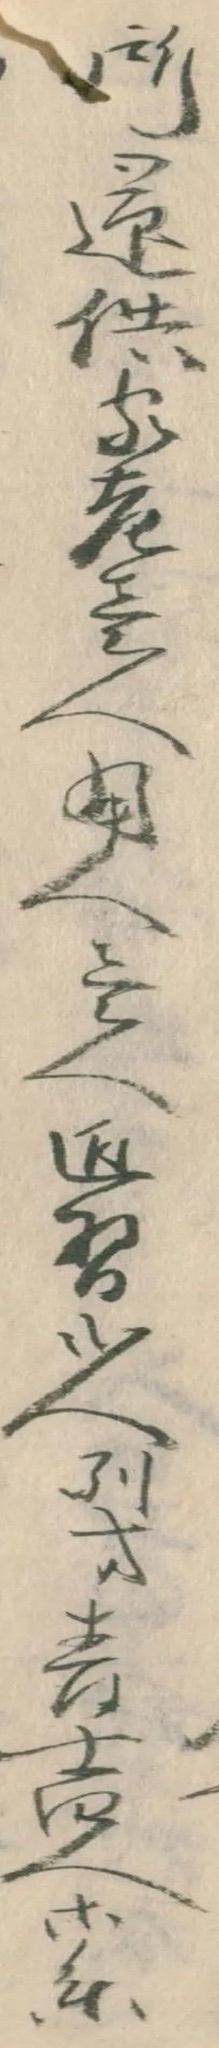所御迎供家老壱人用人壱人近習弐人列方青士四人御参
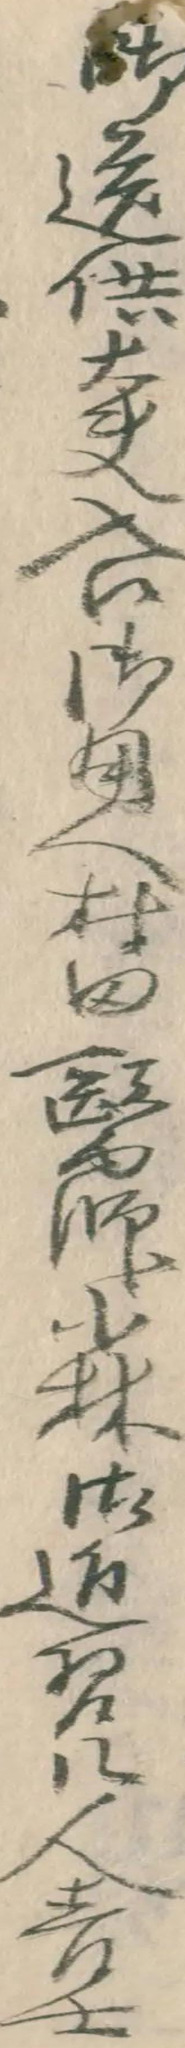御送供大夫入江御用人村田醫師小林御近習八人青士

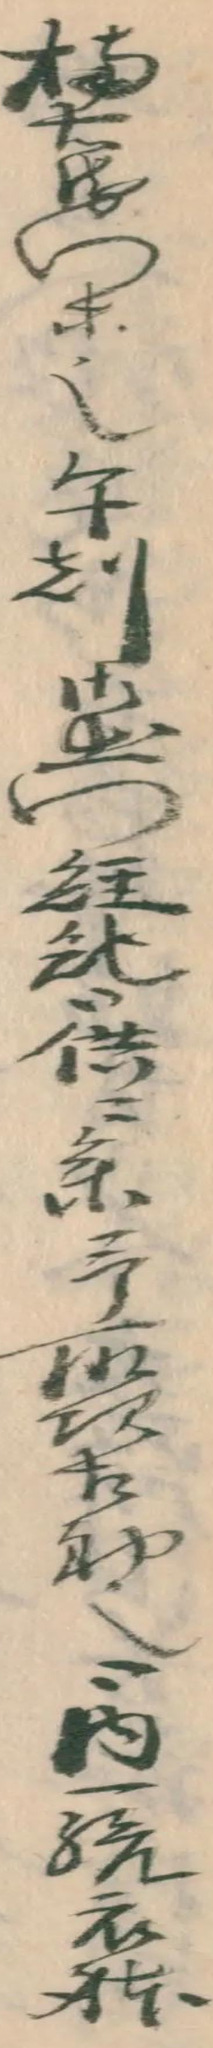楠右衛門等也午刻御出門経紀御供ニ参予取次相勤也御内一統衣躰
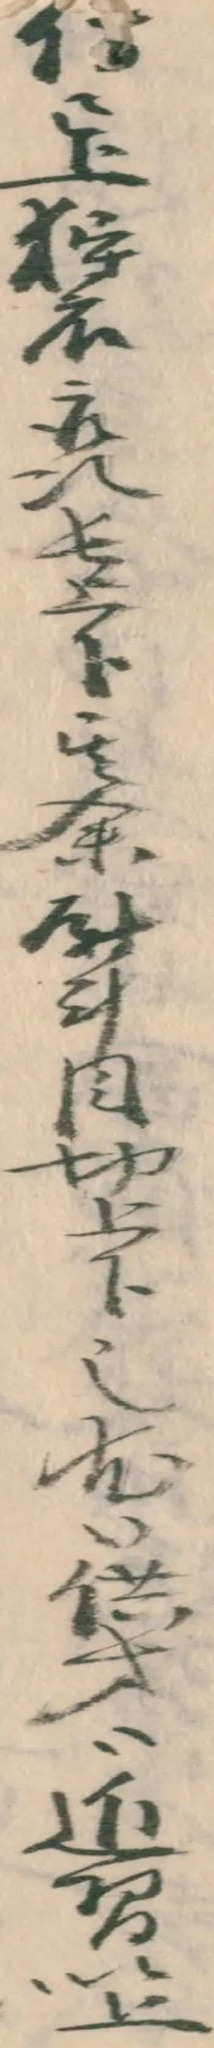侍已上狩衣取次長上下其余熨斗目切上下也尤御供方へ近習以上
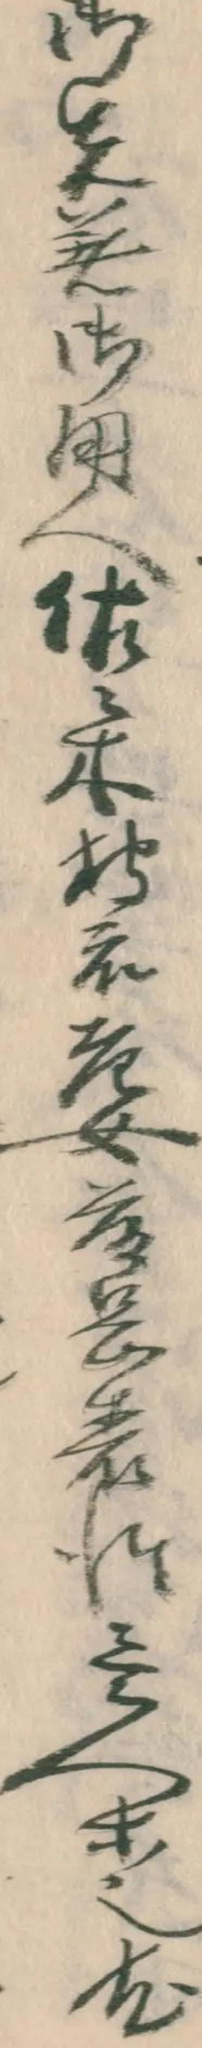御先着御用人佐々木狩衣老女藤岡表壱人等也尤
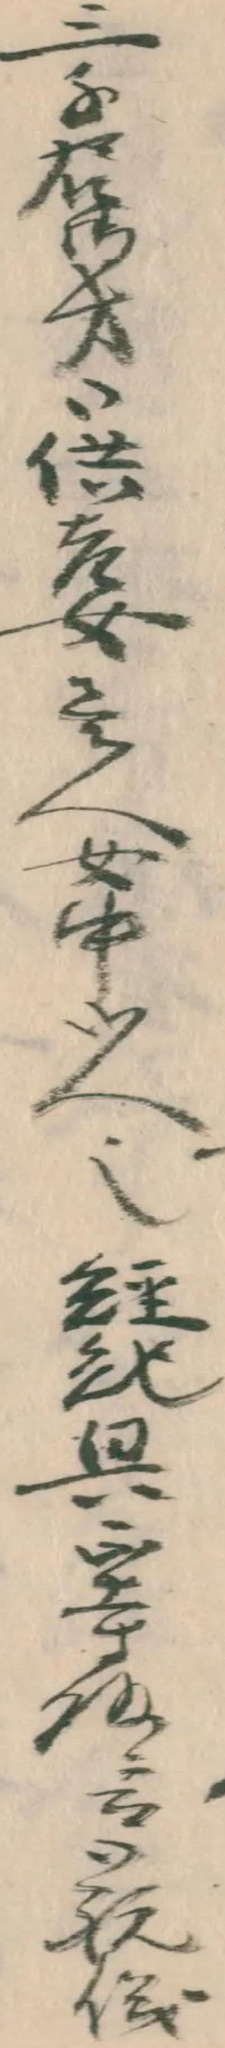三千居御方御供老女壱人女中弐人也経紀具正寺殿ニ而御祝儀
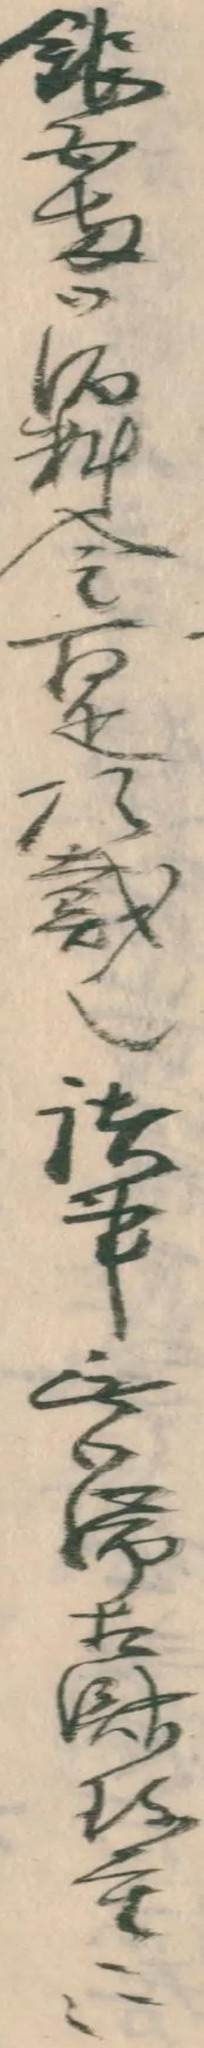銀五両御酒料金百疋頂戴也諸事無御滞相済珍重々々
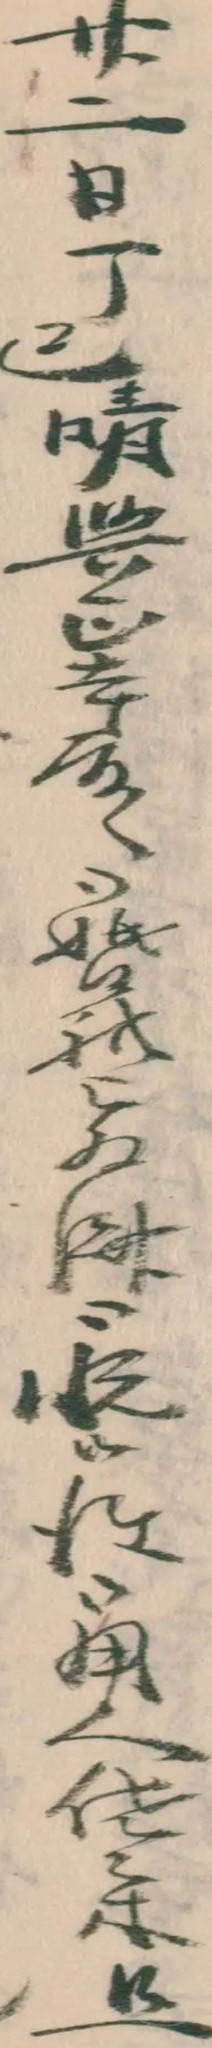廿二日丁巳晴興正寺殿へ御婚礼被為済御祝御役御用人佐々木共へ
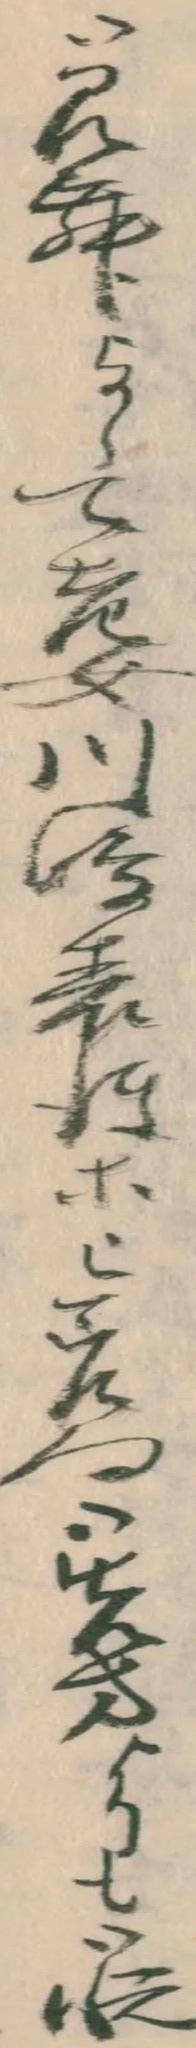御見舞として老女川鳴表役等被差向御先方よりも御祝
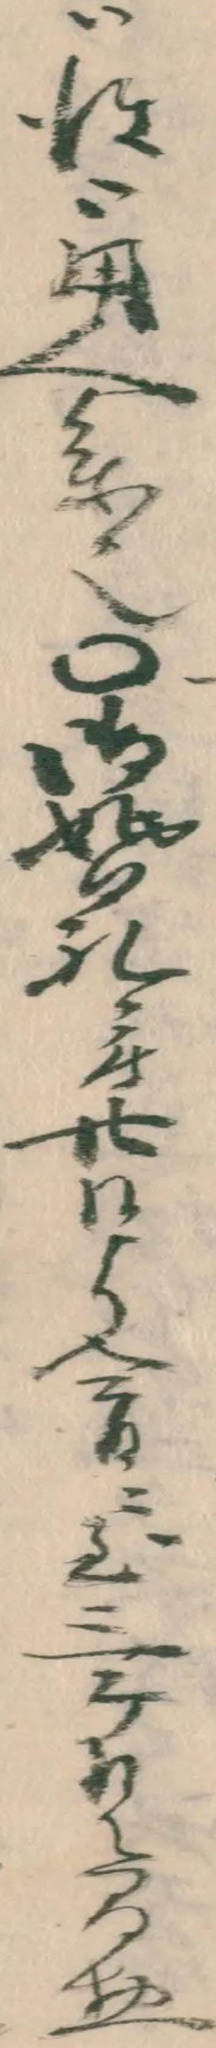御役御用人参也〇御婚礼ニ付廿日より今日ニ至三ヶ月之間惣
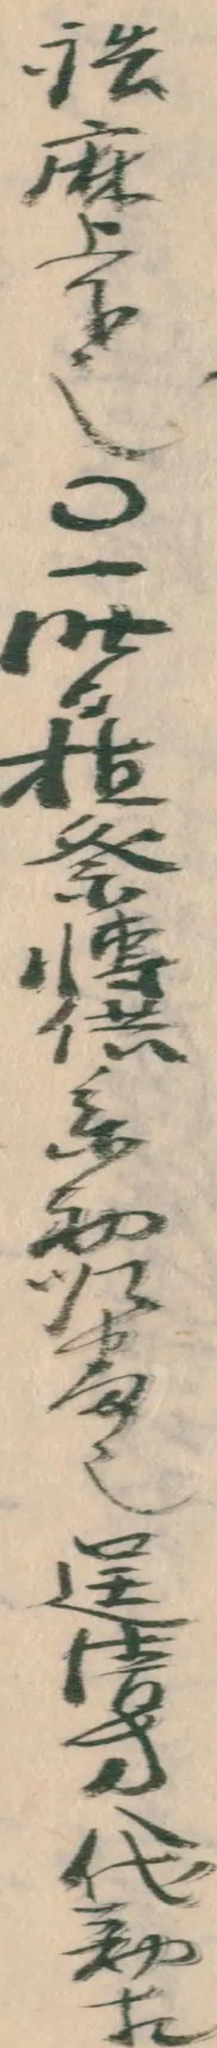躰麻上下也○一昨日植祭轉供参勤順番也逞清方へ代勤相
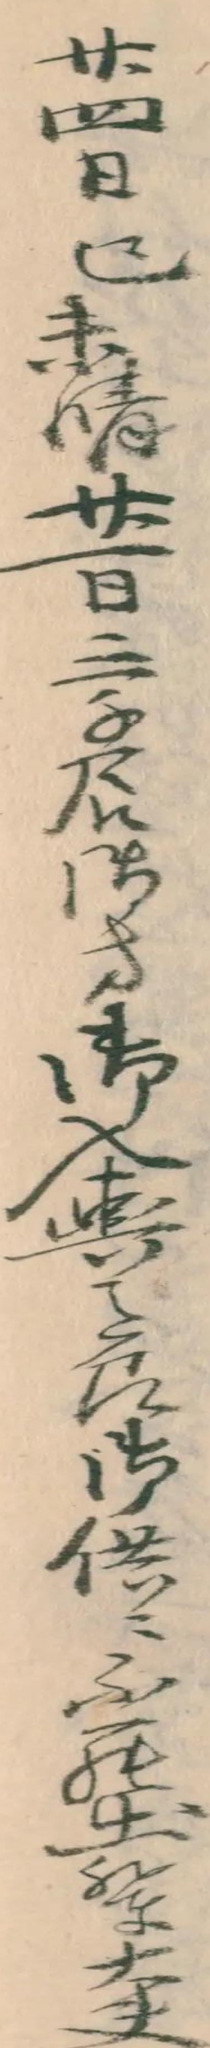廿四日己未晴廿一日三千居御方御入輿之節御供ニ不罷出輩大夫
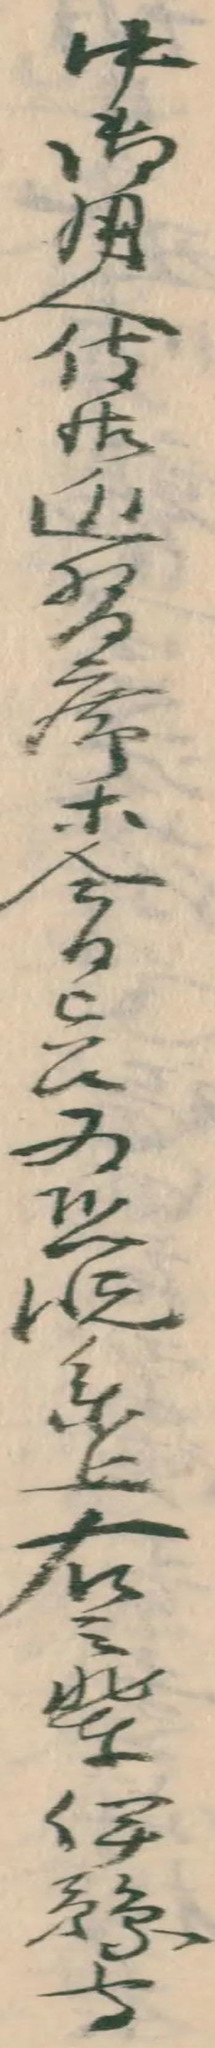中御用人侍御近習席等今日被召為恐悦参上右之輩伊豫守
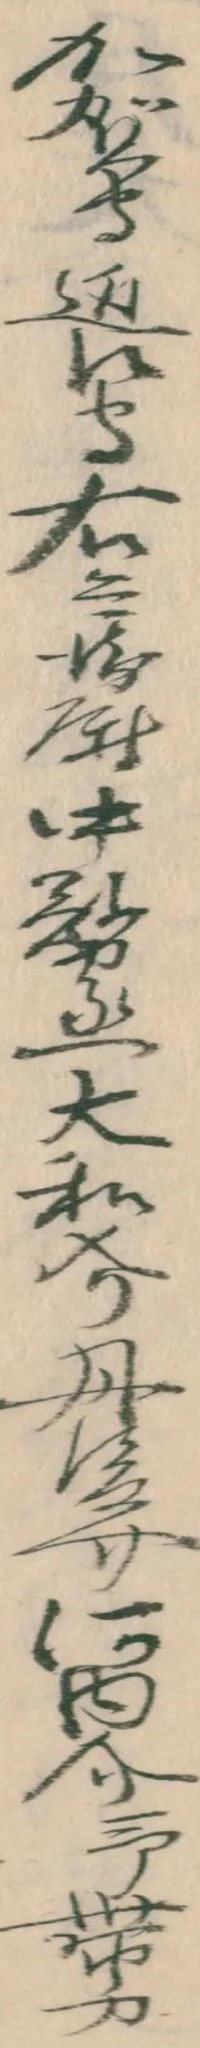加賀守近江守右兵衛尉中務丞大和介丹後介河内介予帯刀
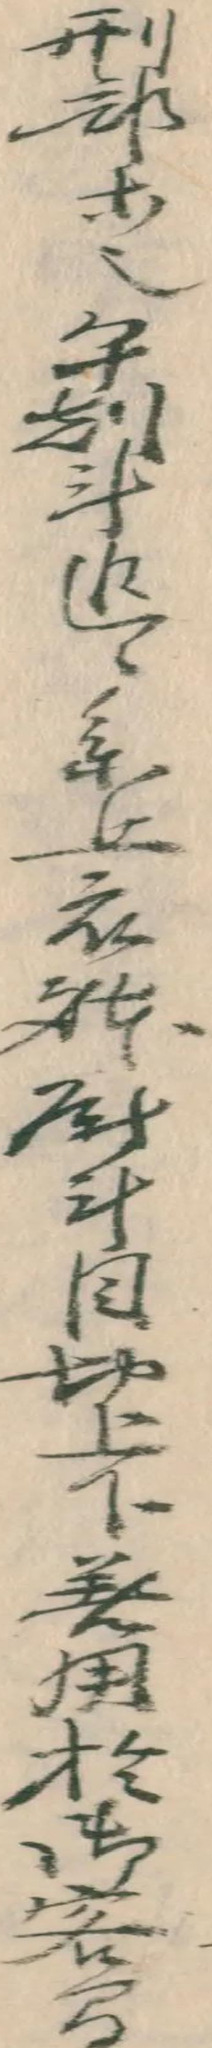刑部等也午刻斗追々参上衣躰熨斗目切上下着用於御客間
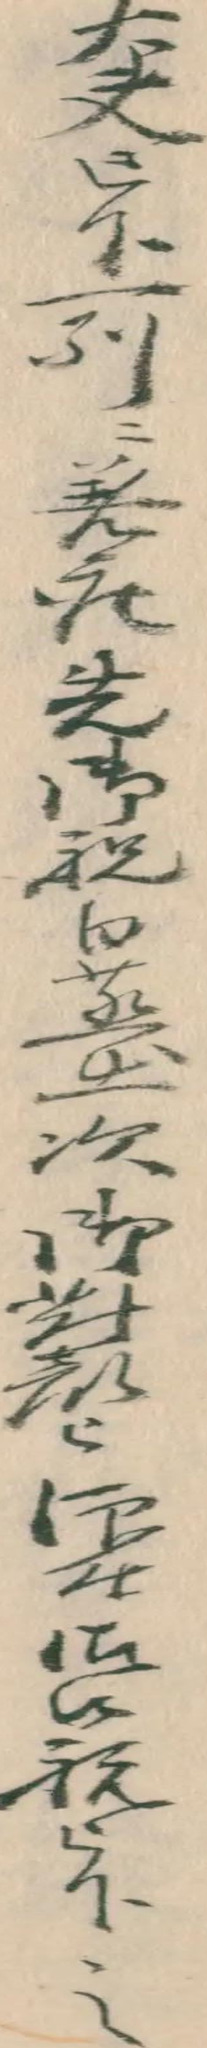大夫已下一列に着座先御祝白蒸出次御對顔被仰付御口祝被下也
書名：賀茂社記録. 第66冊
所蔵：国立国会図書館 National Diet Library, JAPAN
